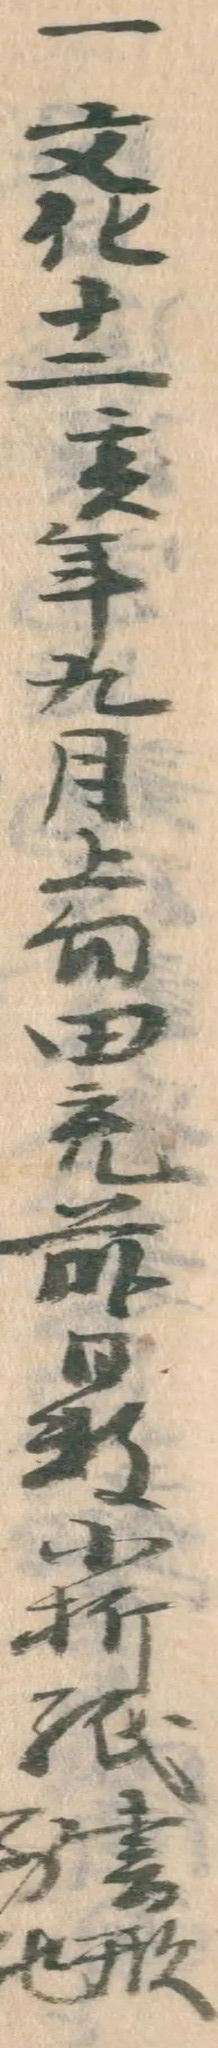一文化十二亥年九月上旬田充前日数小折紙書形別記
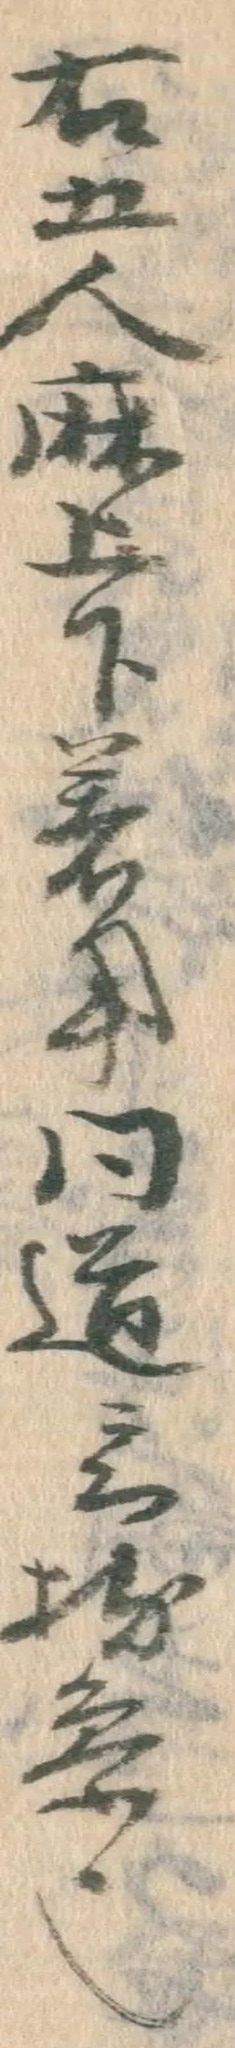右五人麻上下着用、同道にて指参候
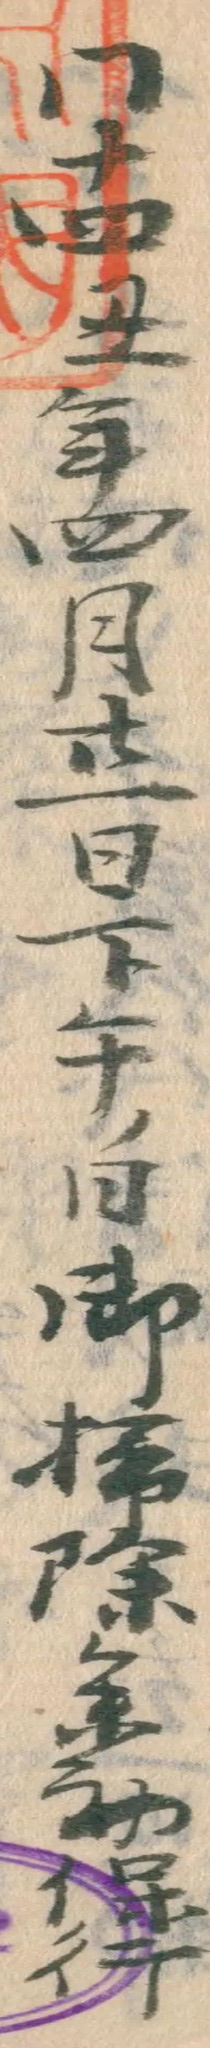一同十四丑年四月廿一日下午ノ日、御掃除参初、保行・
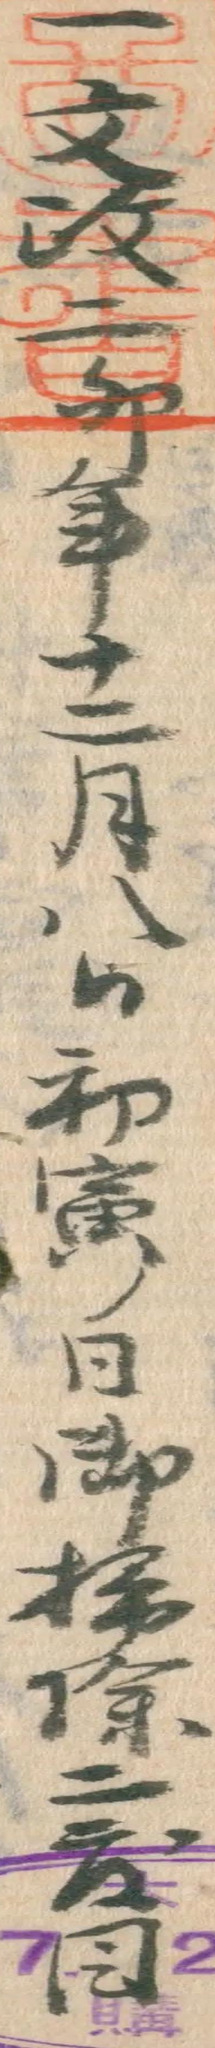一文政二卯年十二月八日初寅ノ日、御掃除二度同
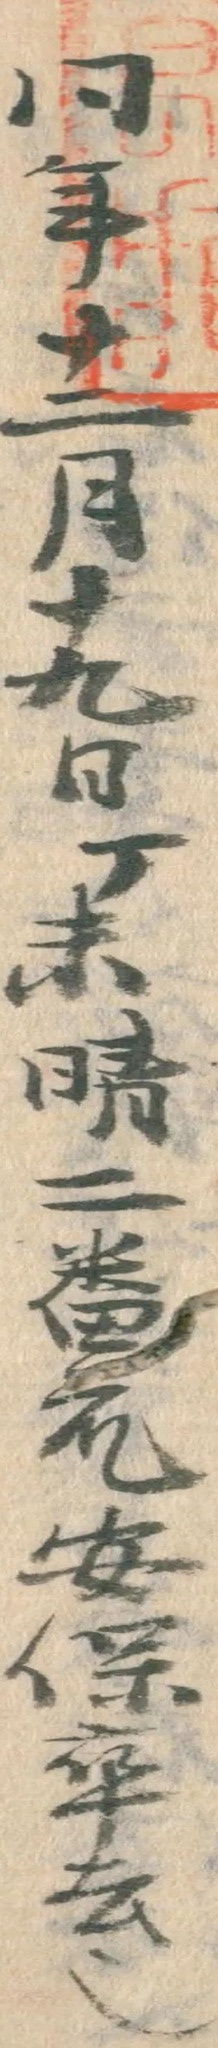一同年十二月十九日丁未晴、二番衆安保卒去也
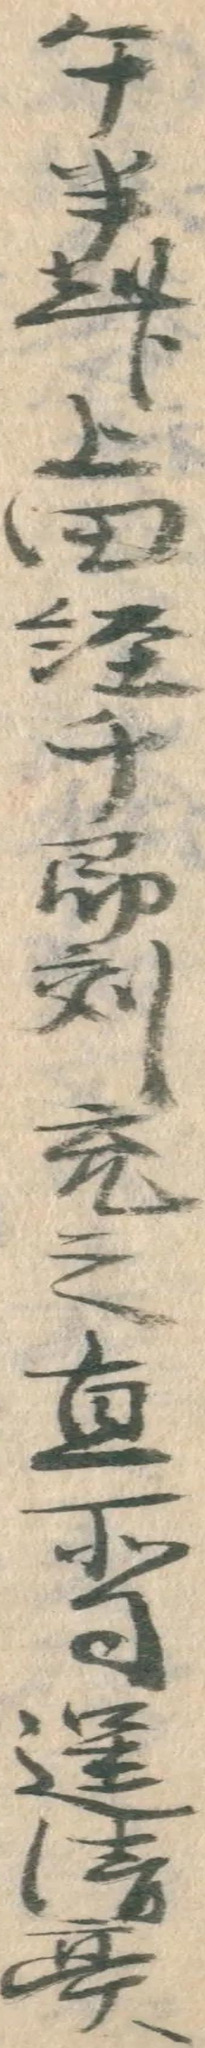午半刻上田、経千即刻充之、直所司逞清亭へ
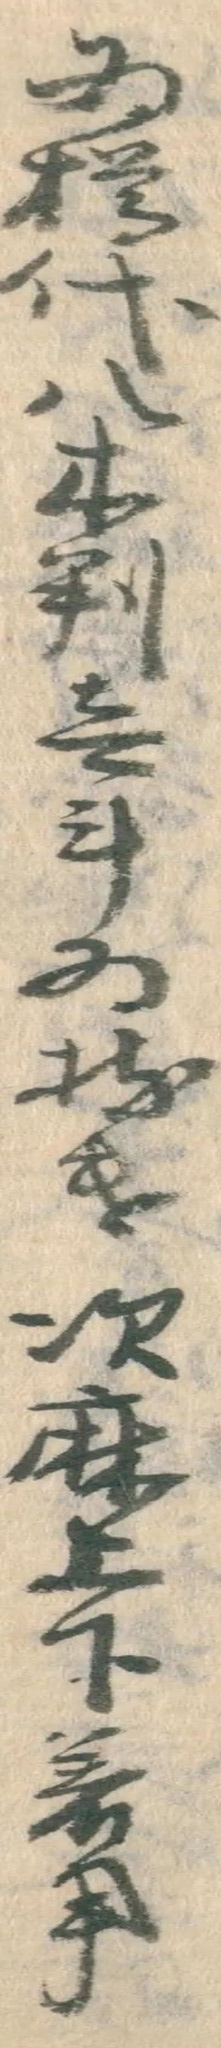為松代八木判壱斗為持遣、次麻上下着用
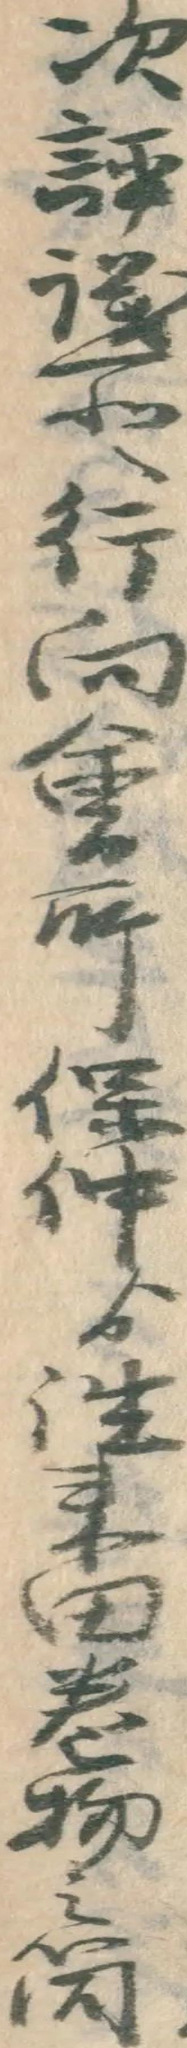次評議所へ行向、會所保仲ゟ往来田巻物之筒

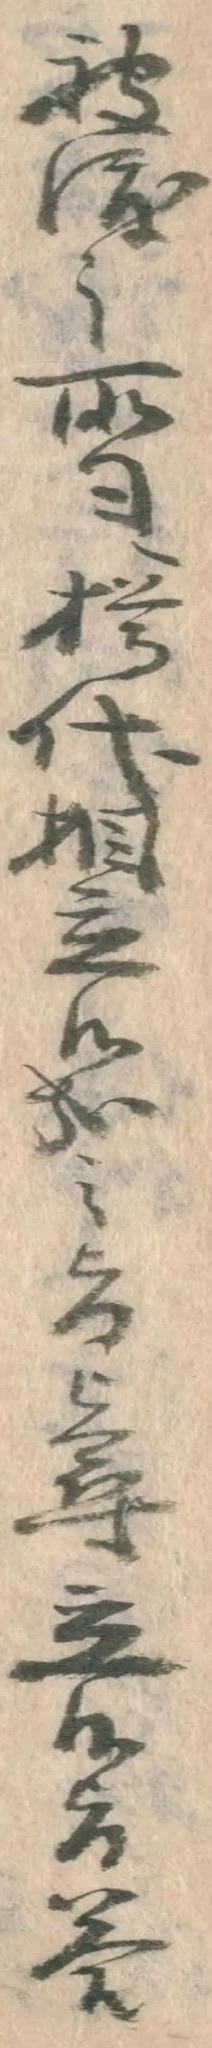被渡之、所司ヘ樽代相立候哉之旨被尋、立候旨答
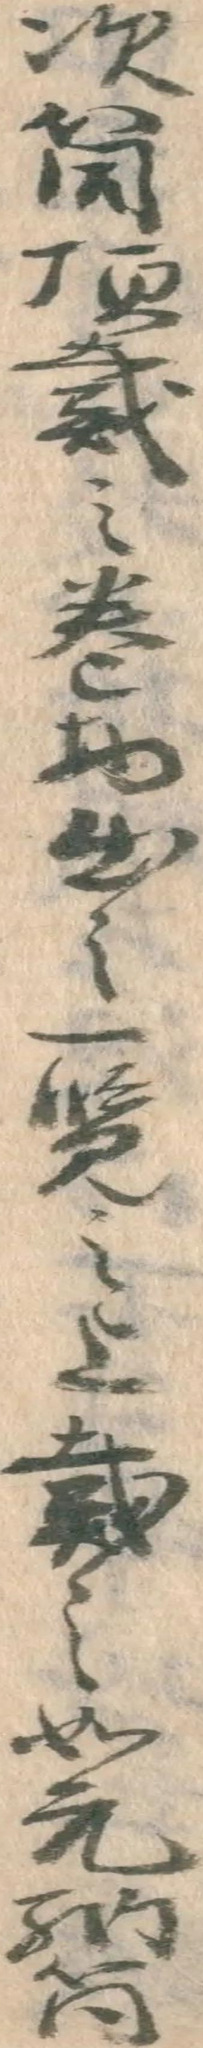次筒頂戴之巻物出之、一覧之上載之、如元納筒
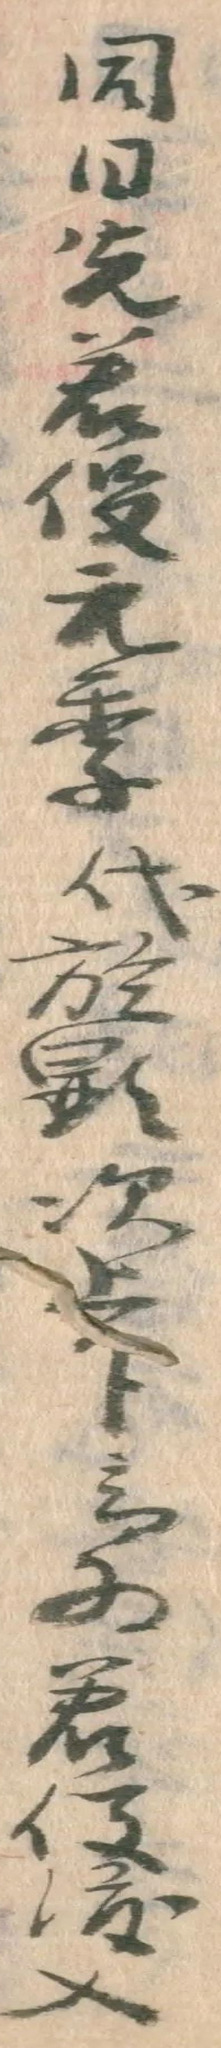同日先若役元季代於顕、次上分ニ而為若役渡入
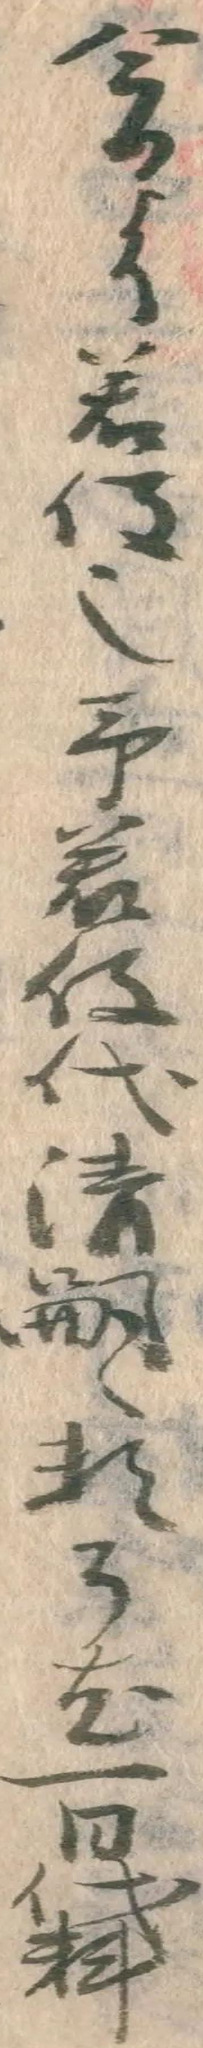今日より若役也、予若役代清嗣へ頼了、尤一日代料
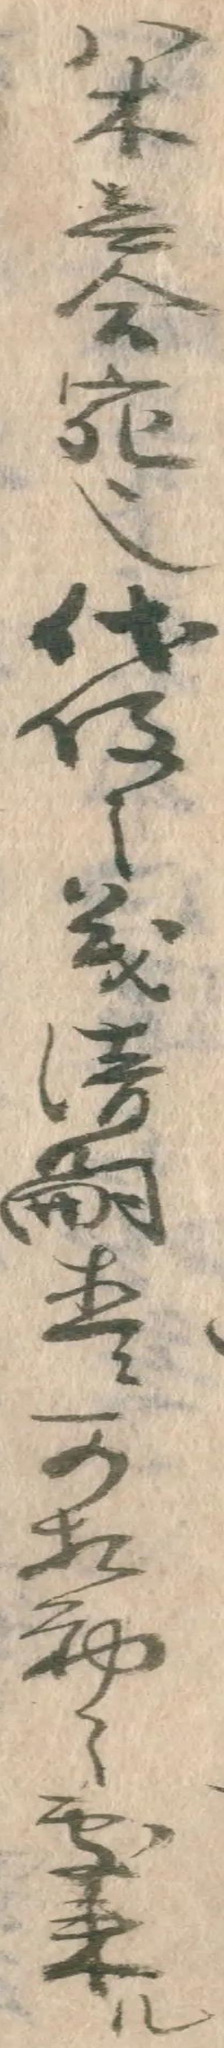八木壱合宛也、代役之義清嗣直ニ可相勤之処、来ル
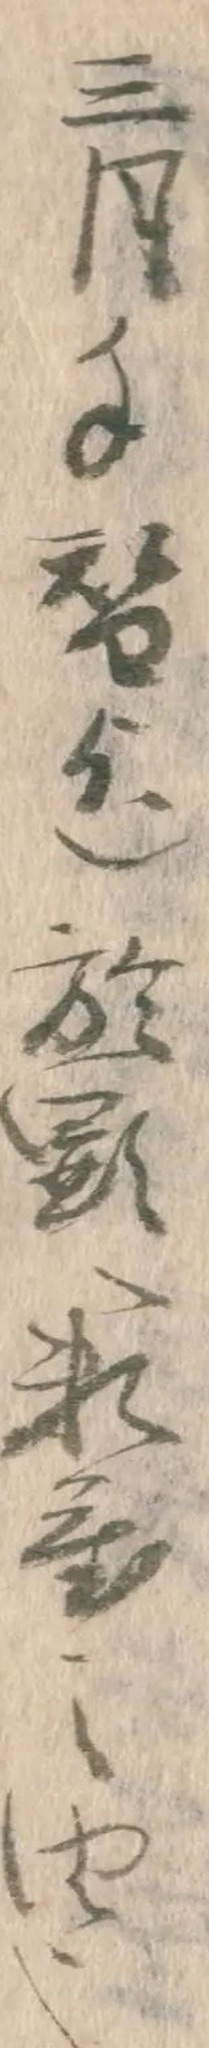三月手替迄於顕へ頼置之由也、
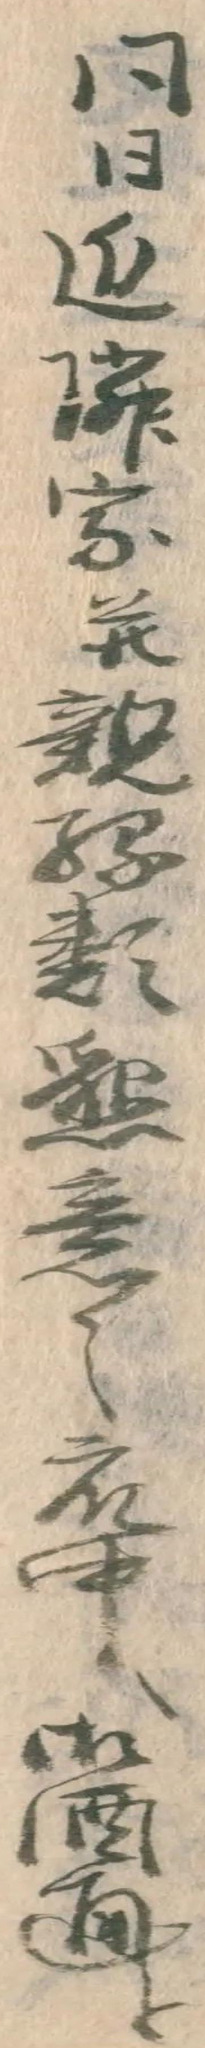同日近隣家并親縁類・懇意之衆中へ、御酒通を
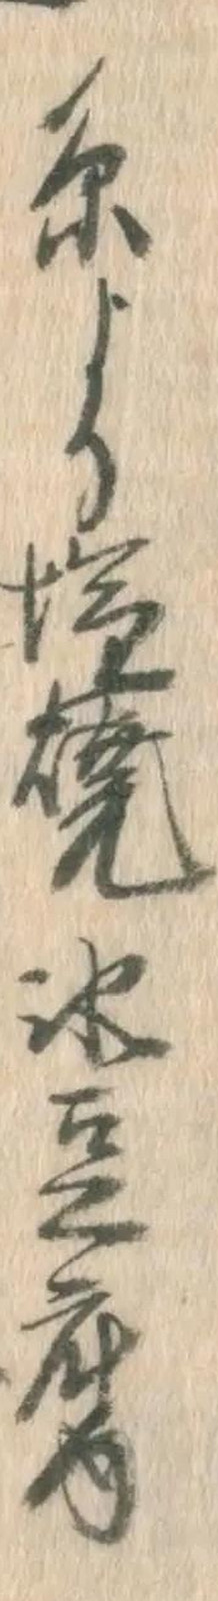糸より塩焼池豆腐
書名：賀茂社記録. 第63冊
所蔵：国立国会図書館 National Diet Library, JAPAN
